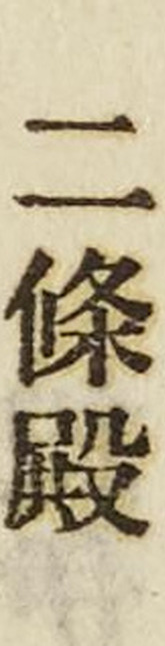二條殿
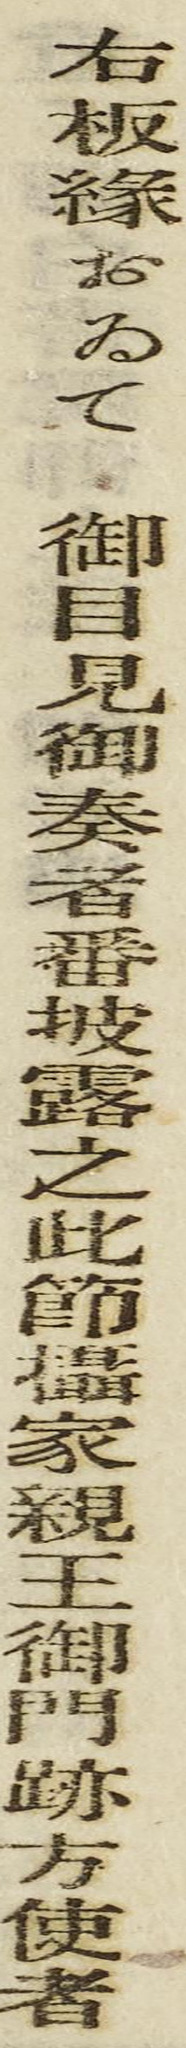右板縁おゐて御目見御奏者番披露之此節摂家親王御門跡方使者
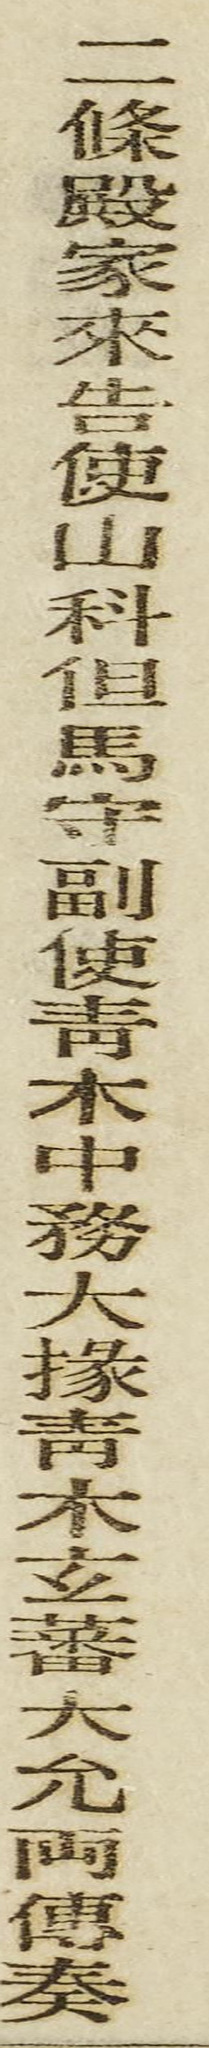二條殿家来告使山科但馬守副使青木中務大掾青木玄蕃大允両伝奏
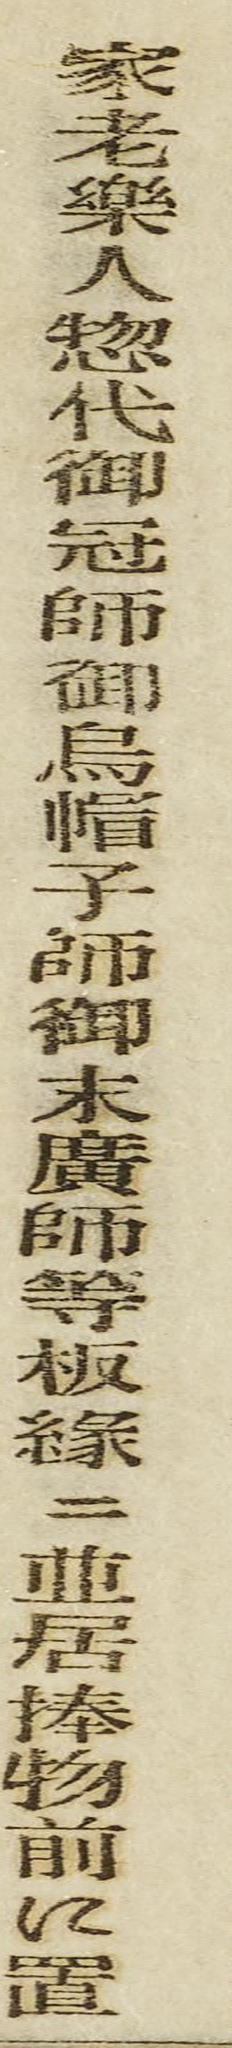家老楽人惣代御冠師御烏帽子師御末広師等板縁ニ並居捧物前に置

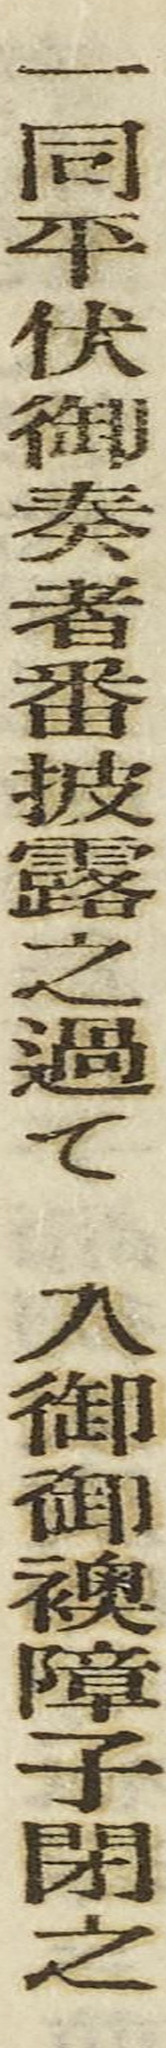一同平伏御奏者番披露之過て入御御襖障子閉之
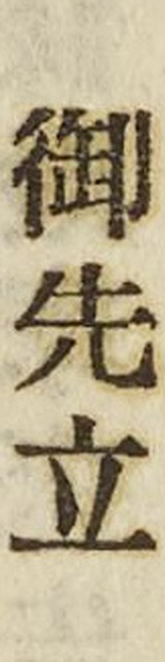御先立
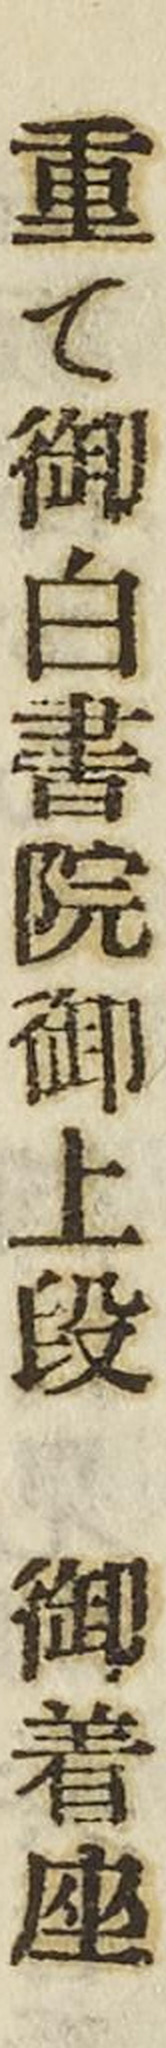重て御白書院御上段御着座
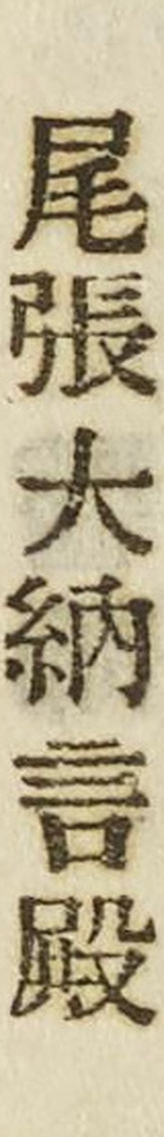尾張大納言殿
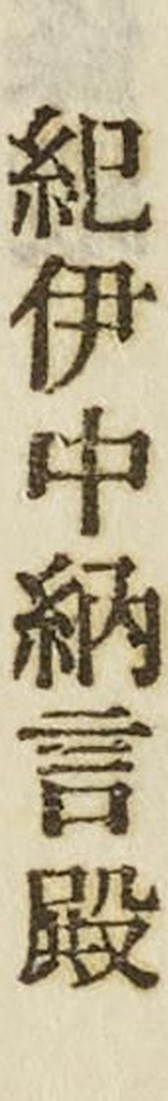紀伊中納言殿
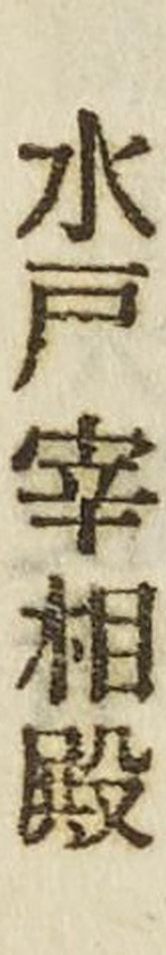水戸宰相殿
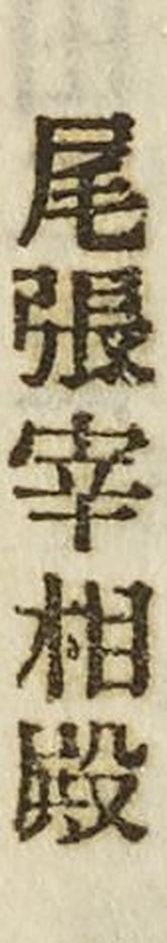尾張宰相殿
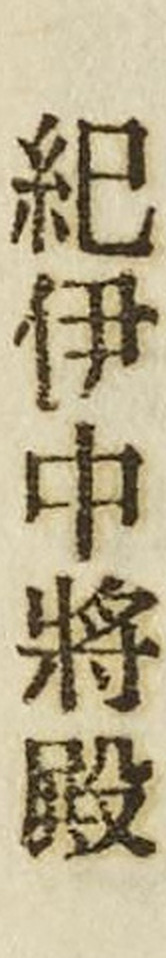紀伊中将殿
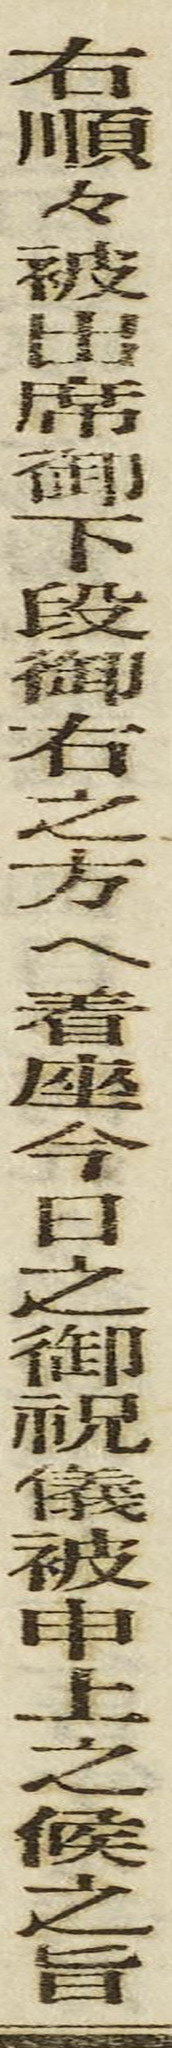右順々被出席下段御右之方へ着座今日之御祝儀被申上之候之旨
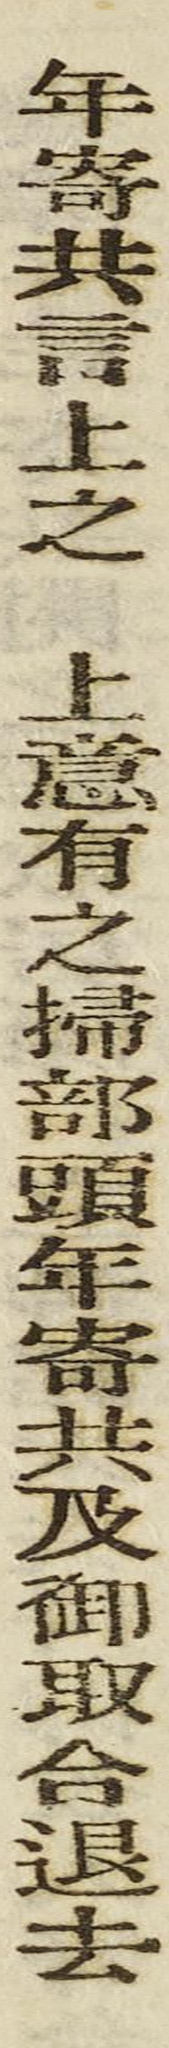年寄共言上之上意有之掃部頭年寄共及御取合退去
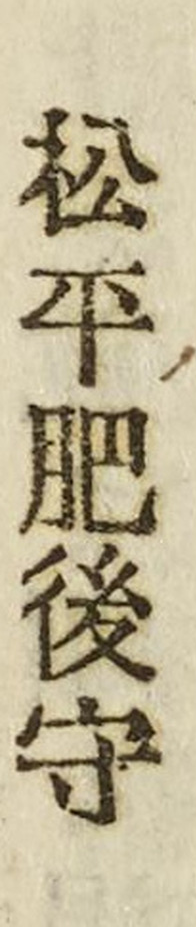松平肥後守
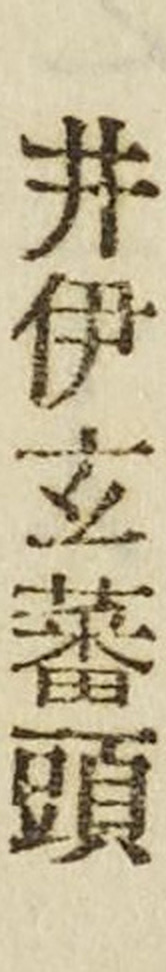井伊玄蕃頭
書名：史籍集覽　朝鮮陣古文・細井廣澤記・颶風紀事・天明七年將軍宣下次第書　全
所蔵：東京大学地震研究所図書室 Earthquake Research Institute Library, The University of Tokyo, JAPAN
